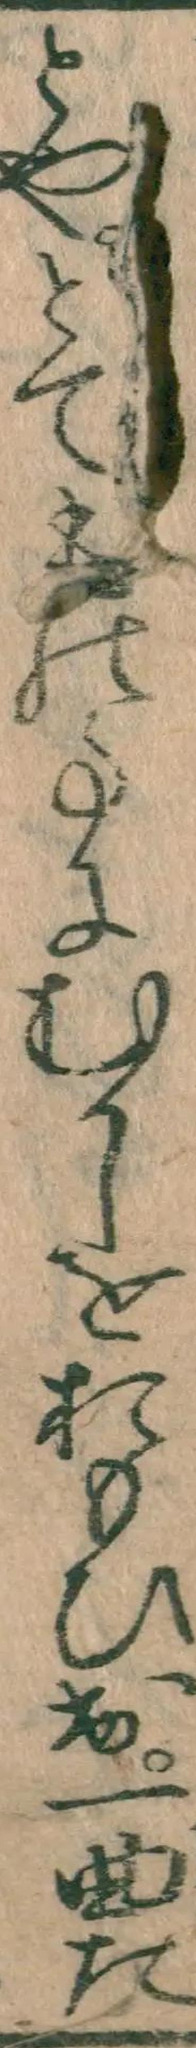とや。とてもの事にむかしをおもひ出。一曲た
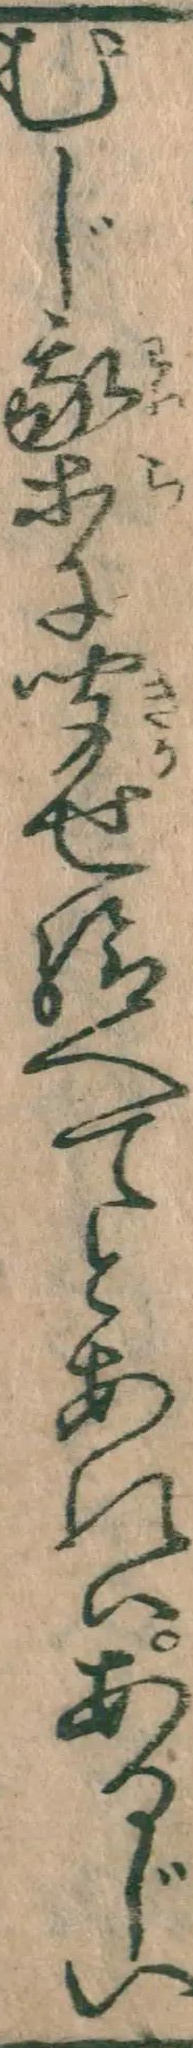むじ我等に聞せ給へてとあれは。あるじい
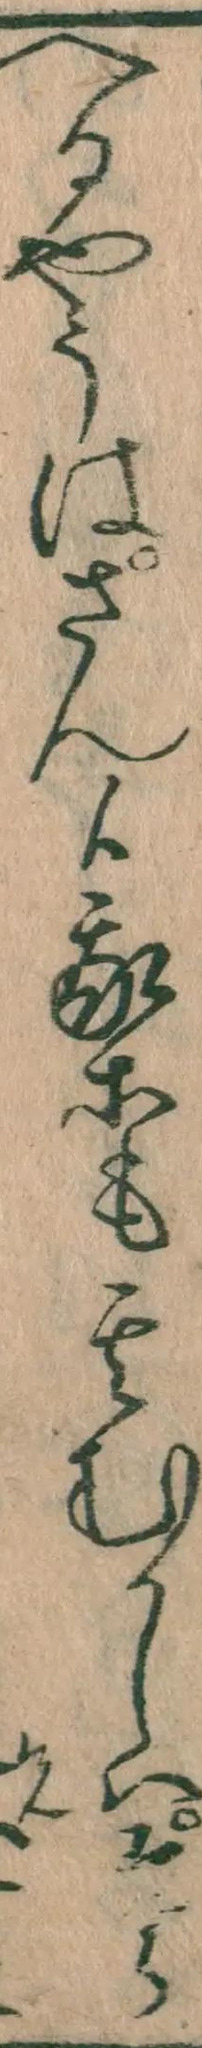へるやうは。さん候我等も其むかしは。そら
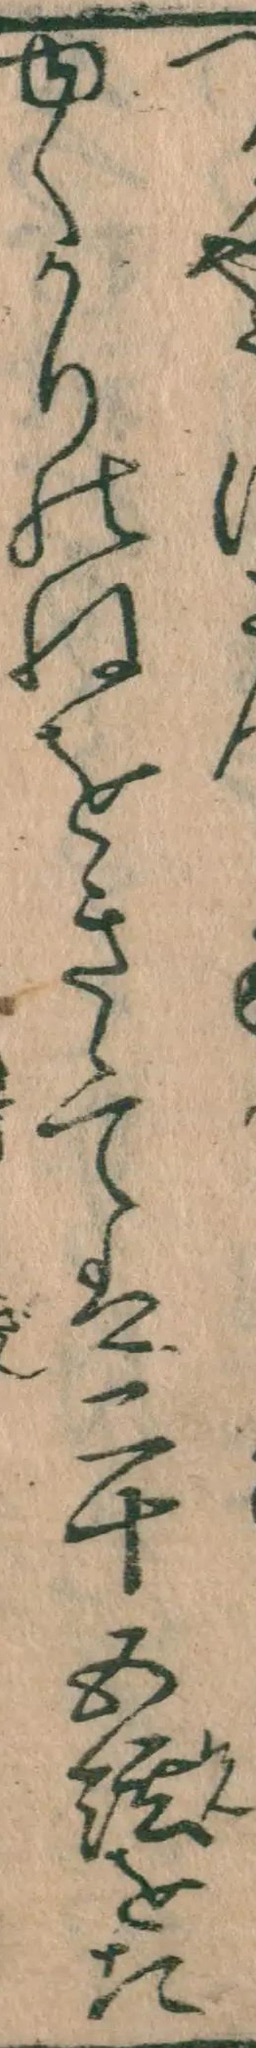ゆくかりのねをきゝては二十五絃をた
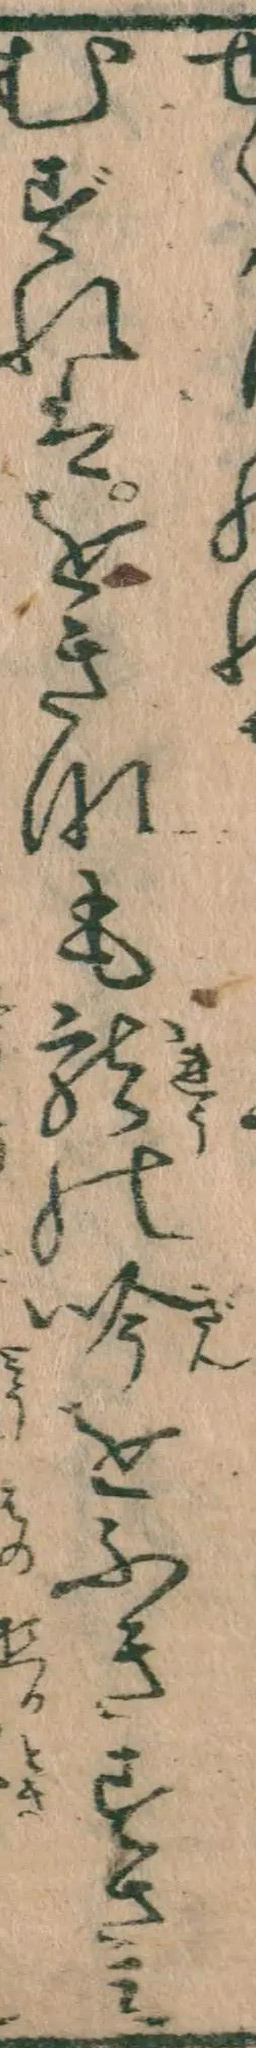むずれは。をきなも龍の吟をふきすさみ
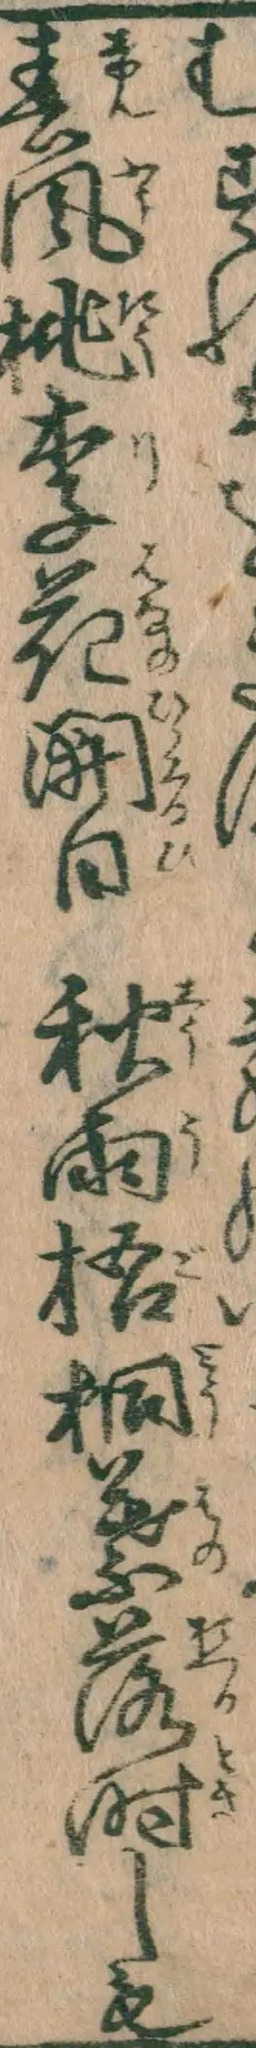春風桃李花開日秋雨梧桐葉落時しも
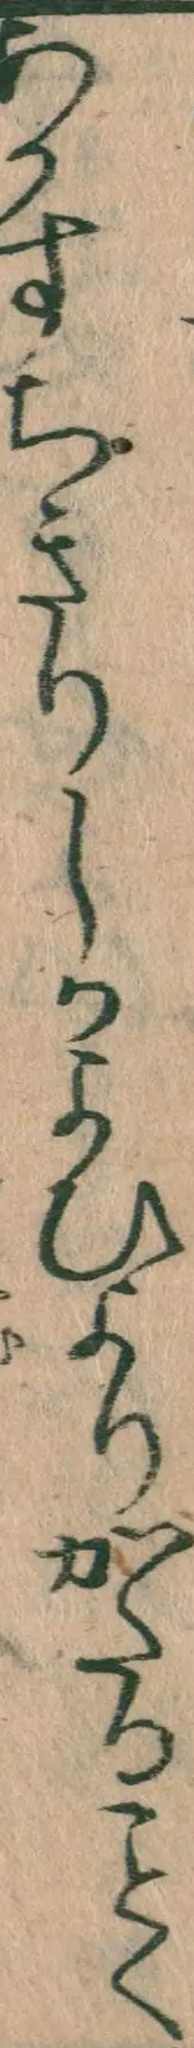あかすちきりしかよひよりかたることく
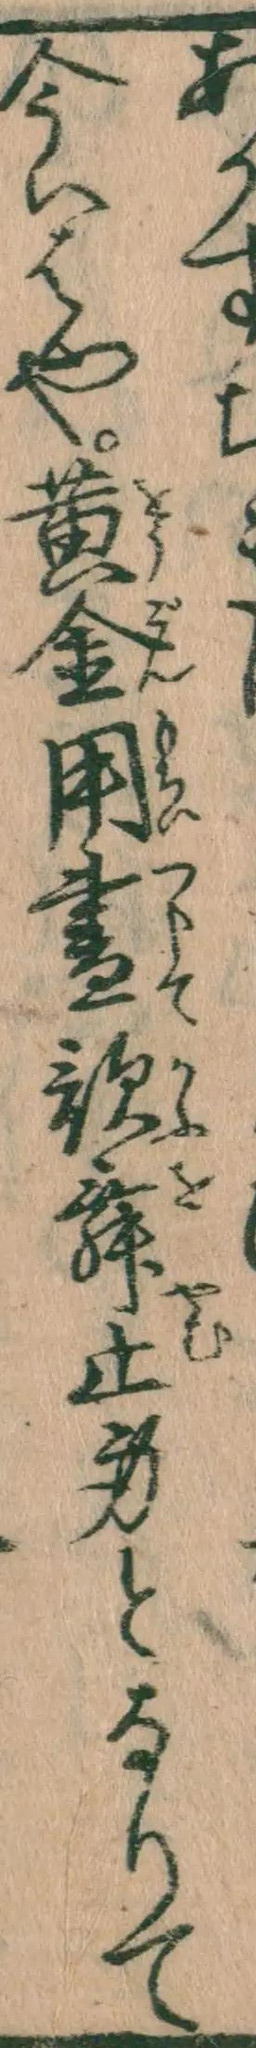今ははや。黄金用尽歌舞止身となりて
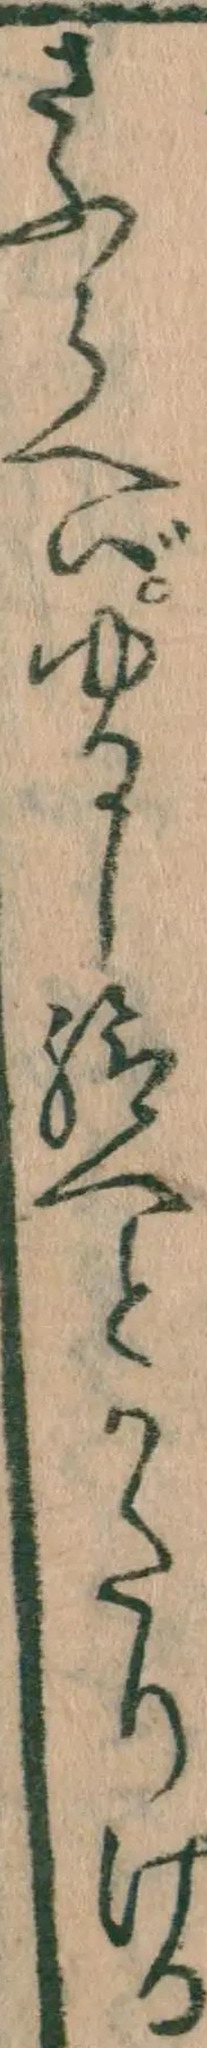さふらへば。ゆるし給へとかたりける

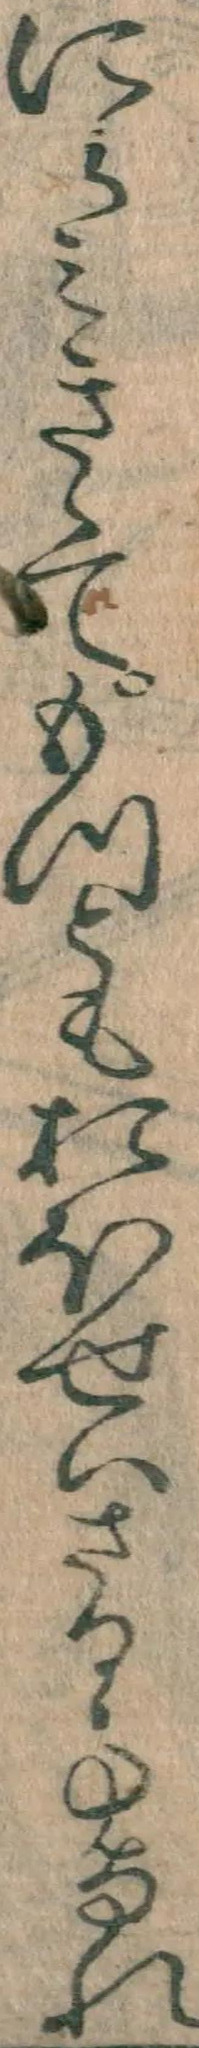にらみきゝて。もつともおほせはさる事なれ
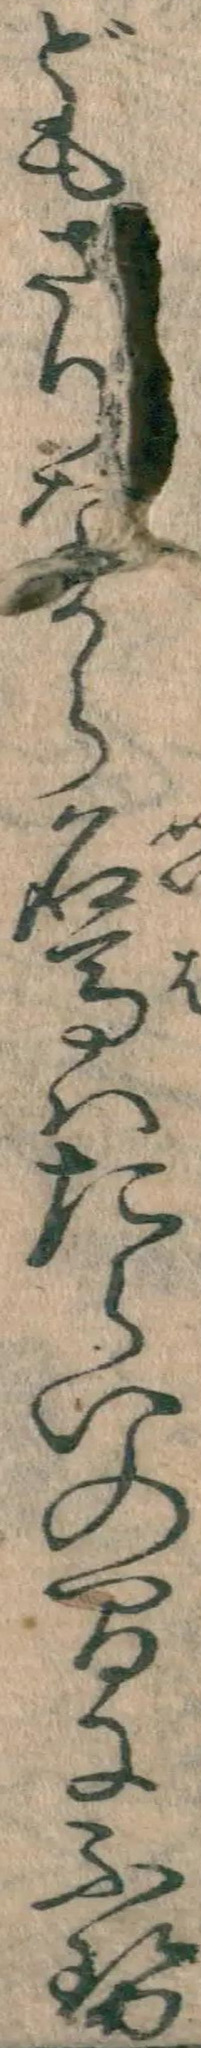どもさりなから名馬はたらいの間にふせ
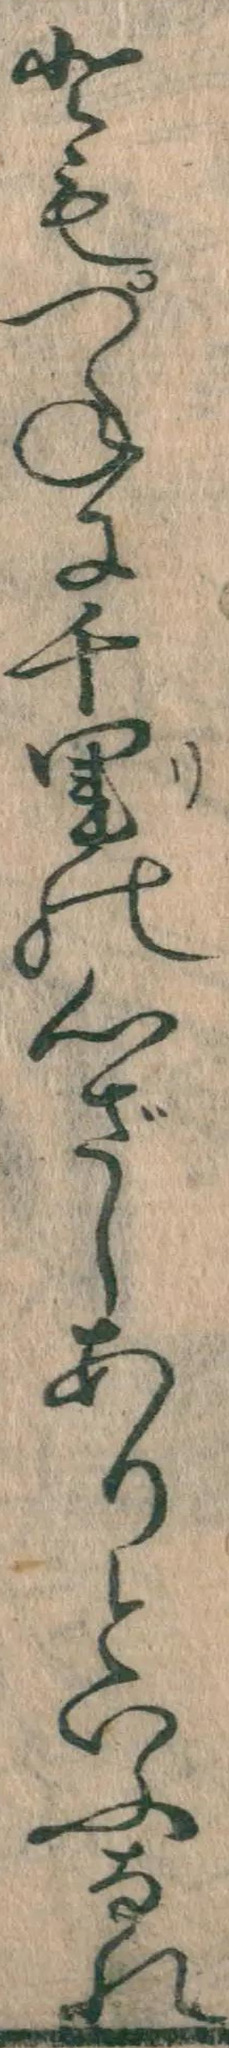とも。つねに千里の心ざしありといふなれ
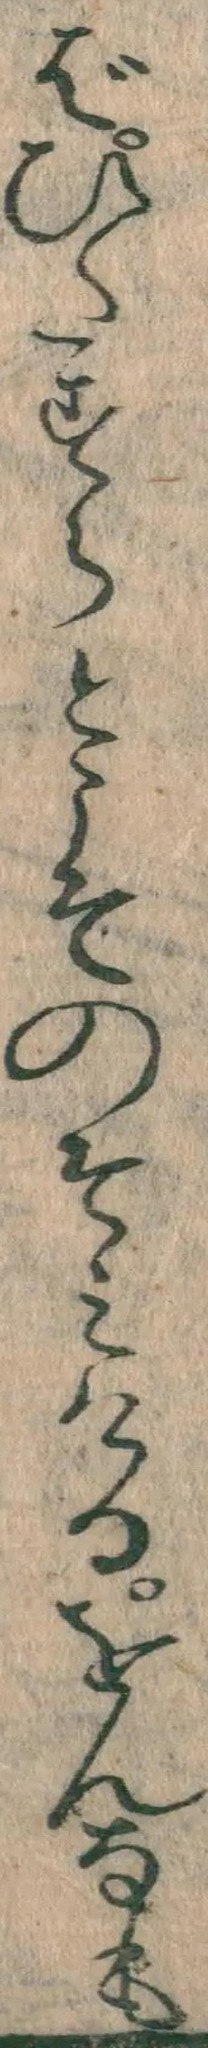ば。ひたすらとこそのそみける。をんなも
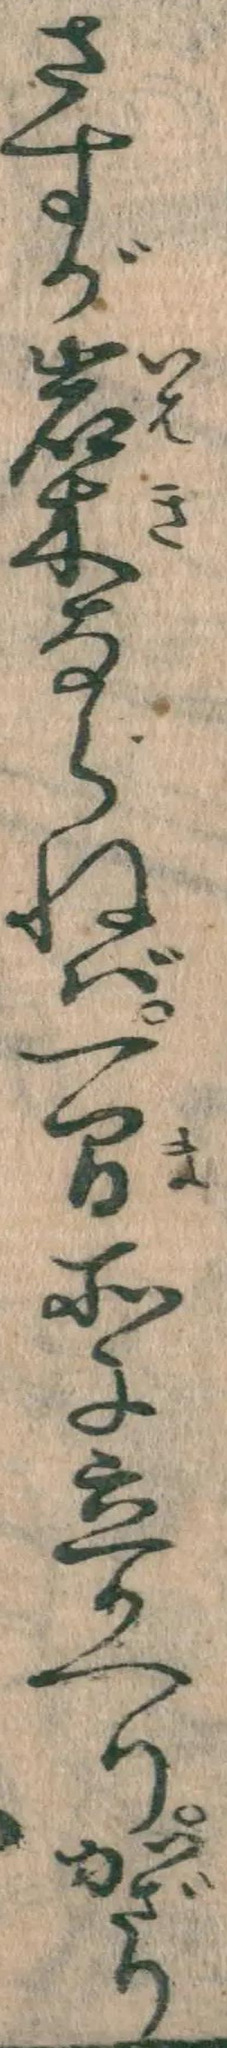さすが岩木ならねば。一間所に立かへり。かざり
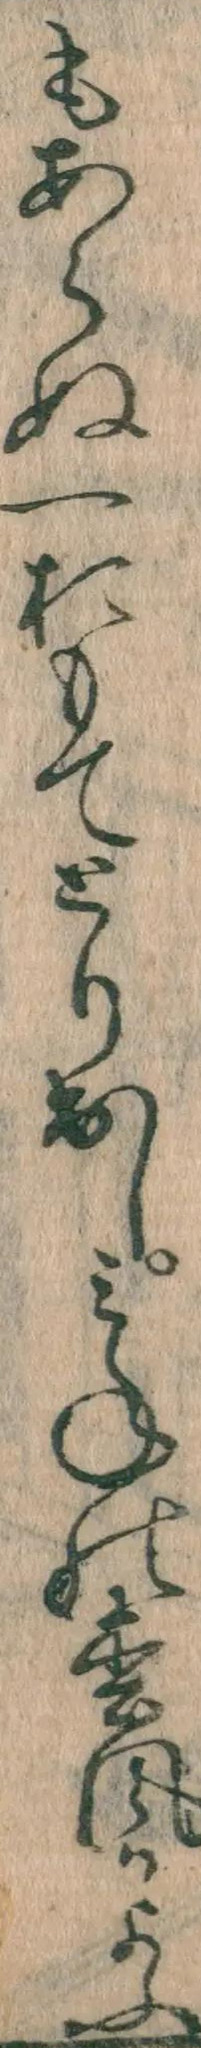もあらぬ一おもてとり出し。みねの春風かよふ
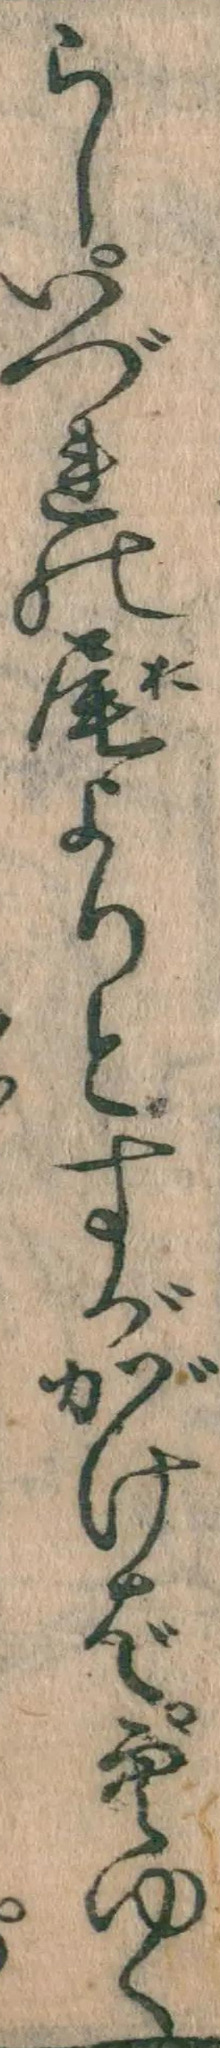らし。いづれの尾よりとすががけば。空ゆく
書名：竹斎狂歌物語 3巻
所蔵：国立国会図書館 National Diet Library, JAPAN
